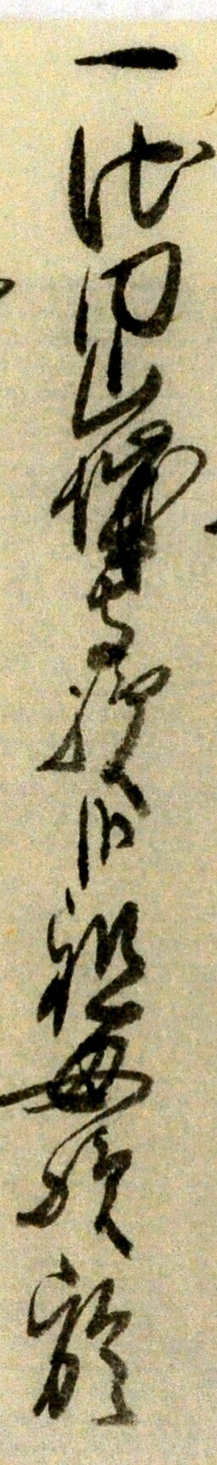一池田山城守様御祖母様於
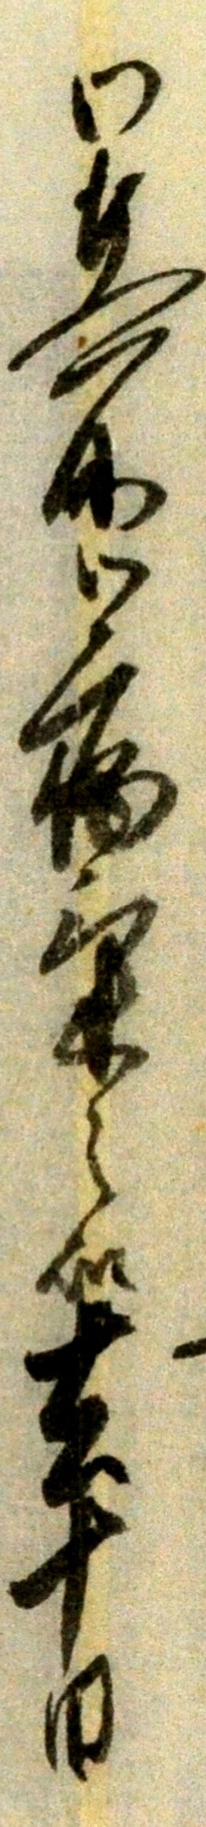御在所御病気之処去十日
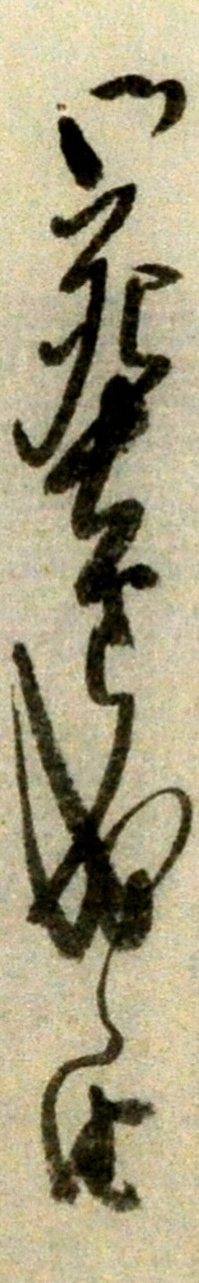御死去被成候由
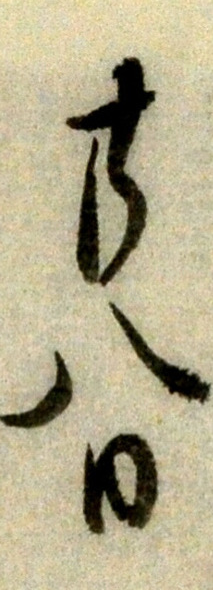廿八日
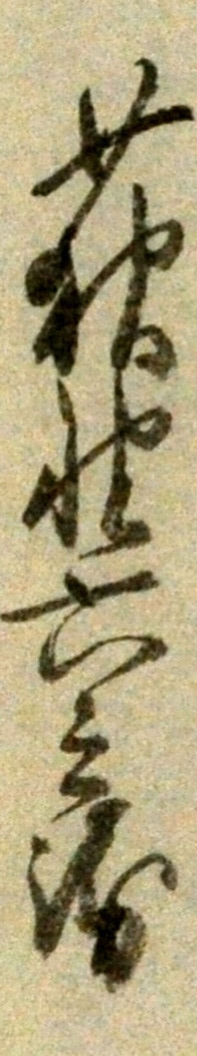荻野六兵衛
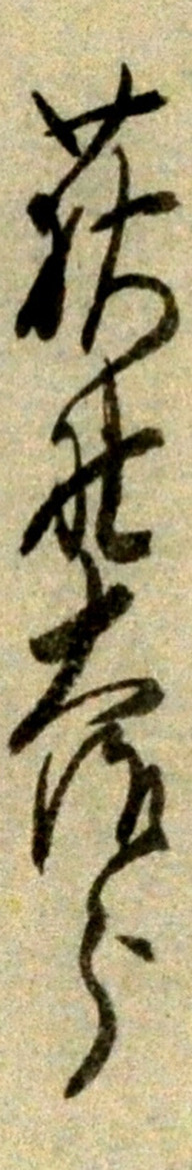荻野大治郎
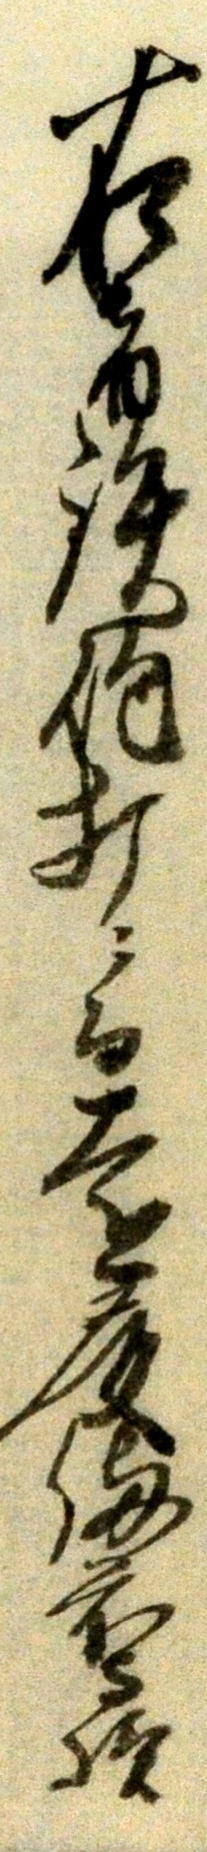右者鉄砲打にて遠藤備前守様
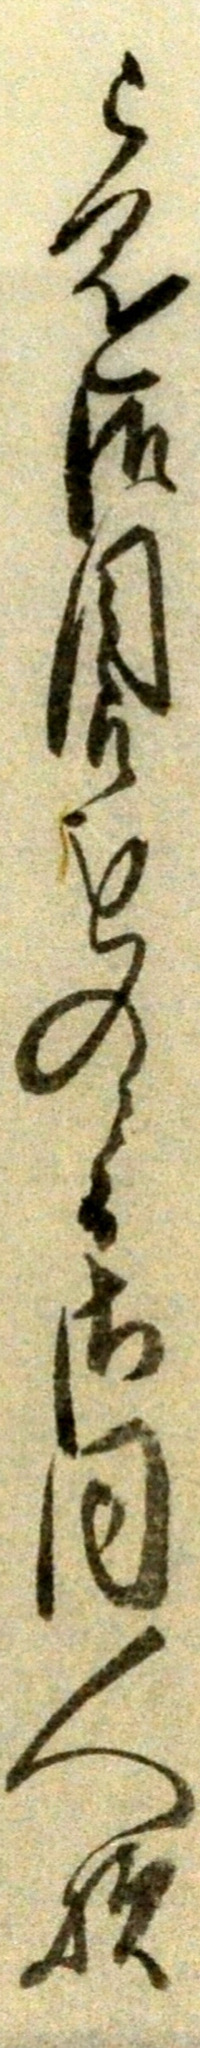被懸御目候ものにて御同人様
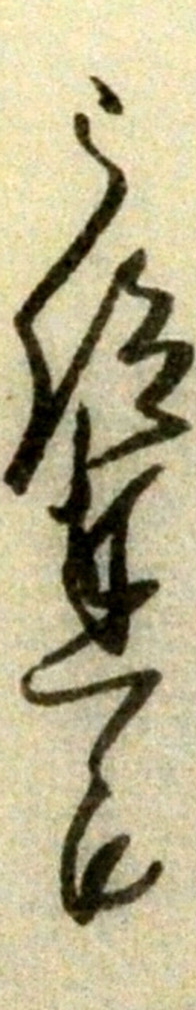被仰達候由
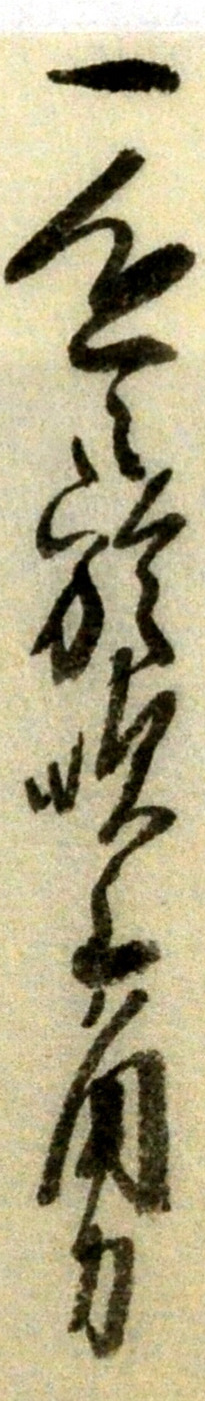一近々於吹上角力

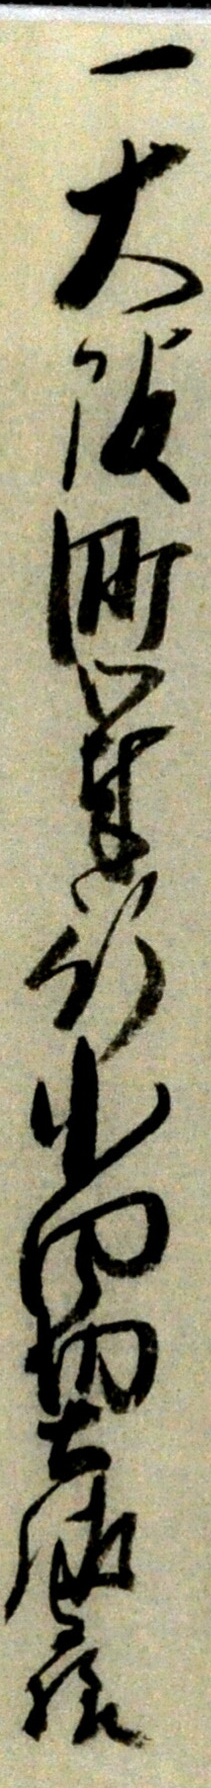一大阪町御奉行小田切土佐守様
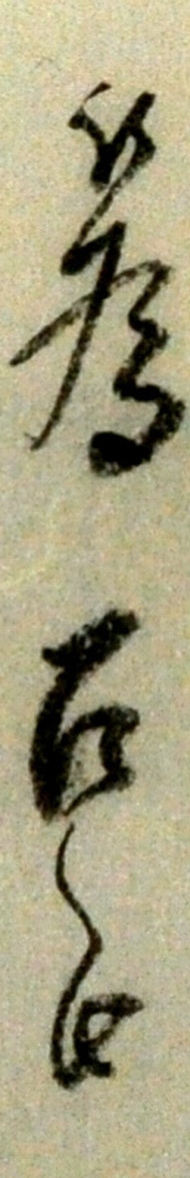被為召候由
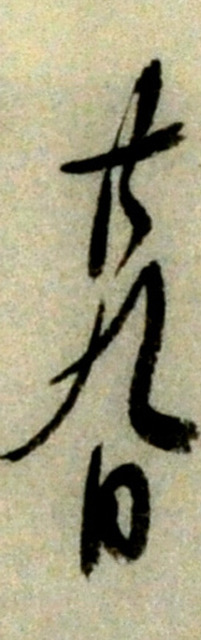廿九日
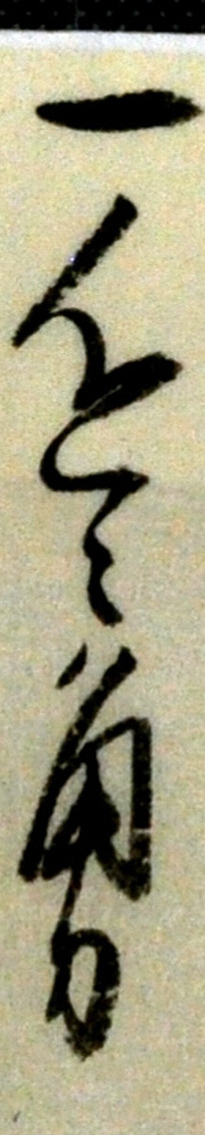一近々角力
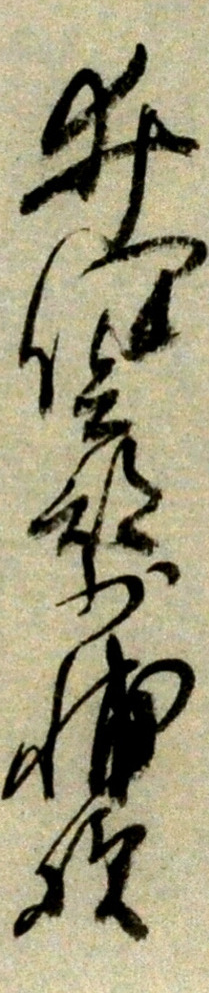井伊兵部少輔様
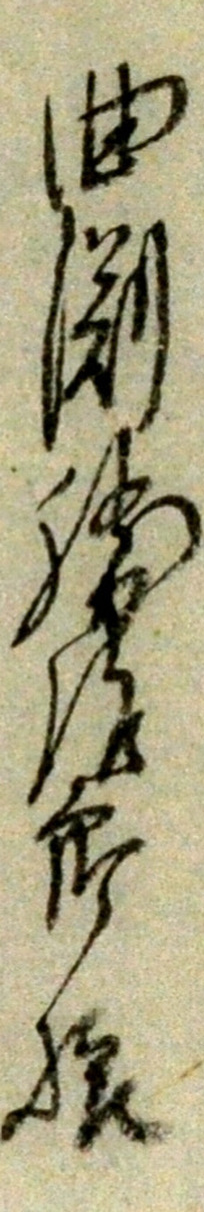曲渕勝治郎様
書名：申合帳〔一括〕
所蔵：伊那市立高遠町図書館・合同会社AMANE
